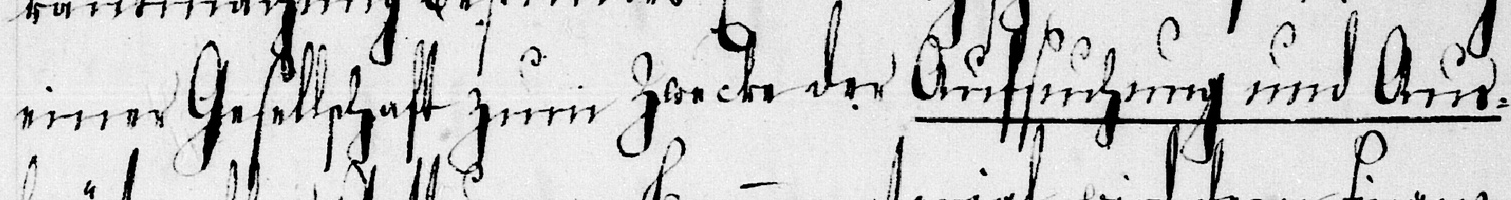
einer Gesellschaft zum Zwecke der Aufsuchung und Aus¬
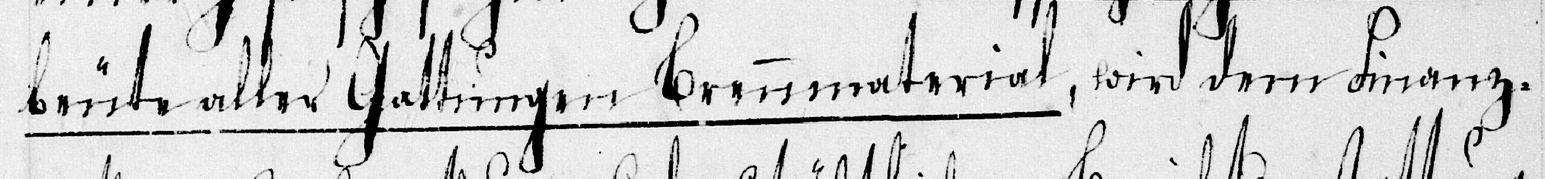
beute aller Gattungen Brennmaterial, wird dem Finanz¬
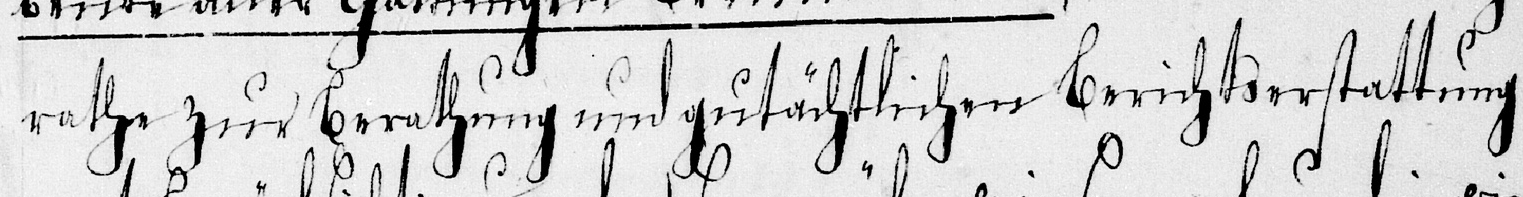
rathe zur Berathung und gutächtlichen Berichterstattung
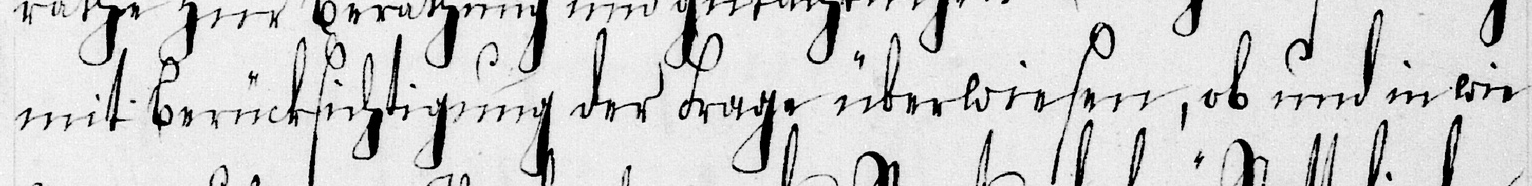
mit Berücksichtigung der Frage überwiesen, ob und in wie
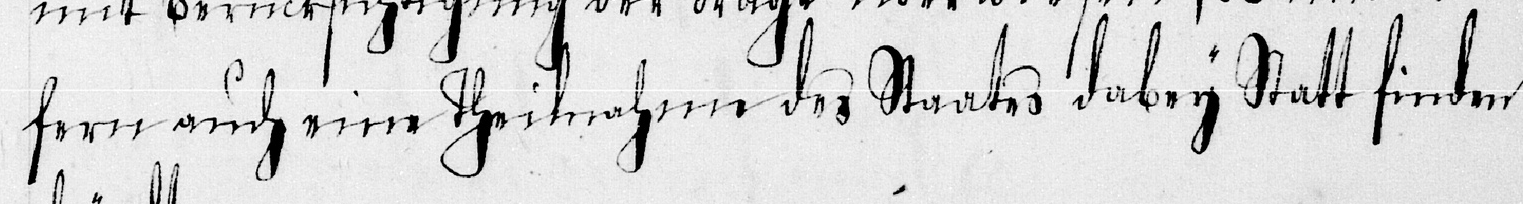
fern auch eine Theilnahme des Staates dabey Statt finden
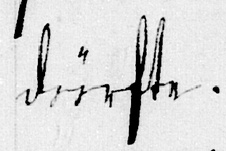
dürfte.
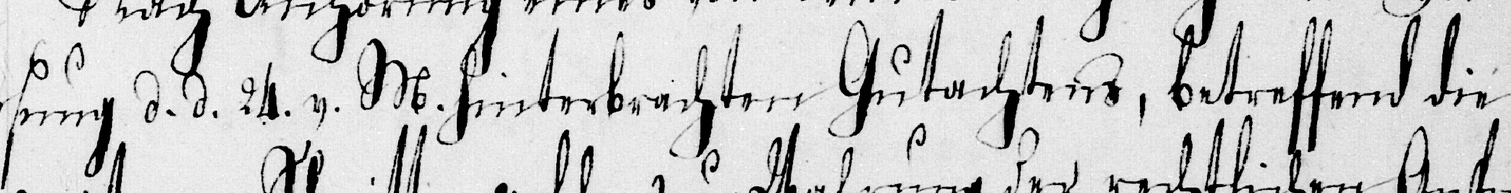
sung d. d. 24. v. M. hinterbrachten Gutachtens, betreffend die
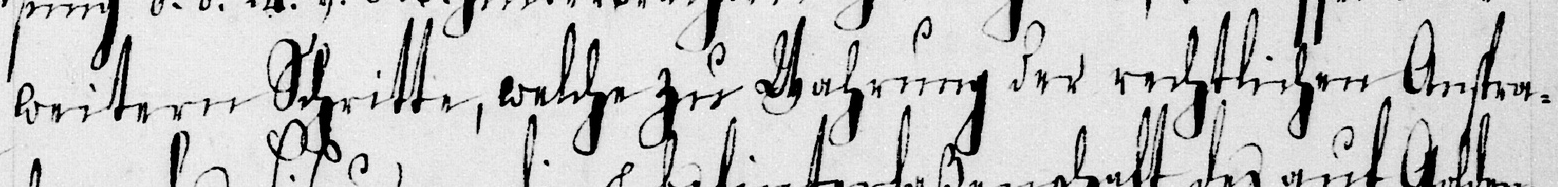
weitern Schritte, welche zur Wahrung der rechtlichen Anspra¬
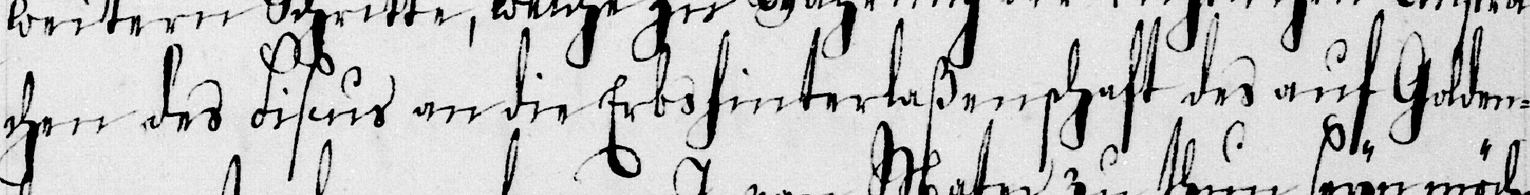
chen des Fiscus an die Erbshinterlaßenschaft des auf Golden¬
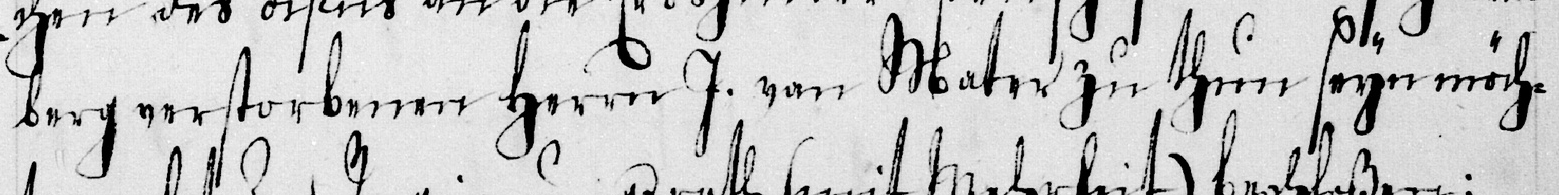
berg verstorbenen Herrn J. van Mater zu thun seyn möch¬
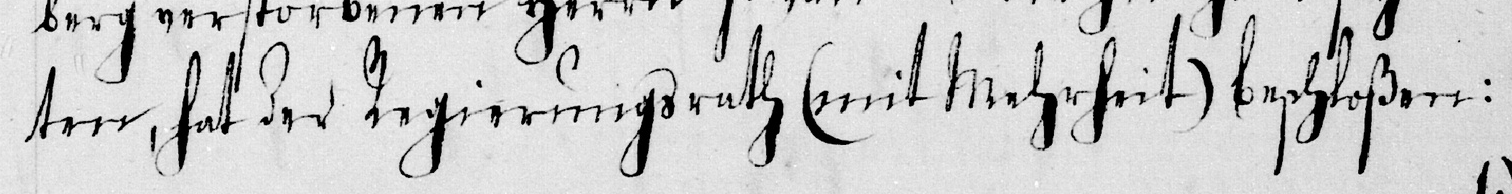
ten, hat der Regierungsrath (mit Mehrheit) beschloßen:
